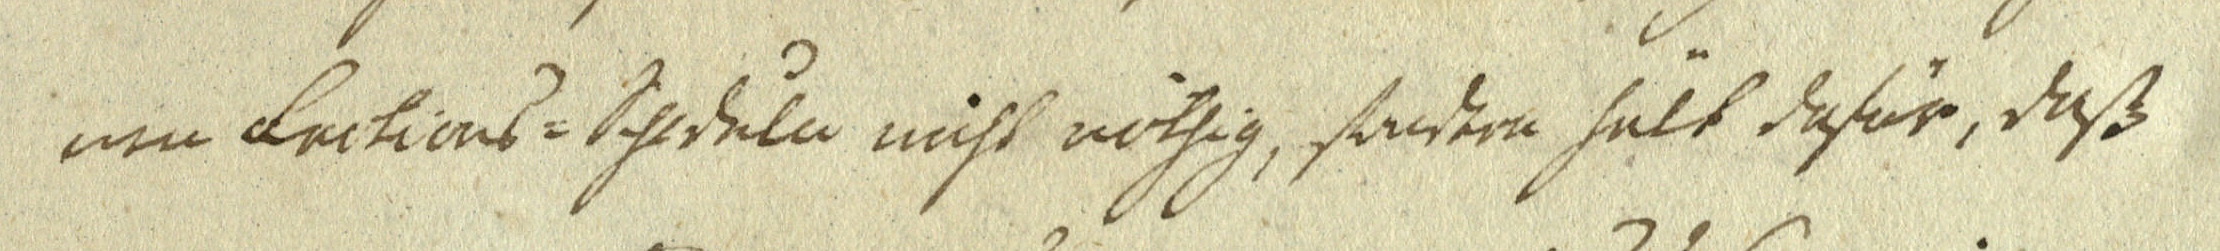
nen Lections- Scheduln nicht nöthig, sondern hält dafür, daß
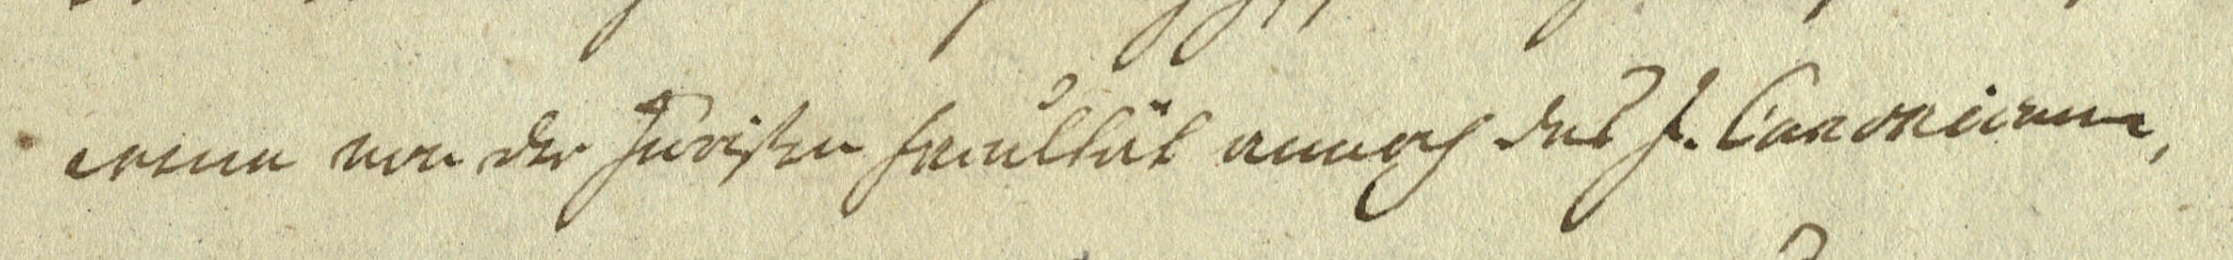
wenn von der Juristen Facultät annoch das J. Canonicum,
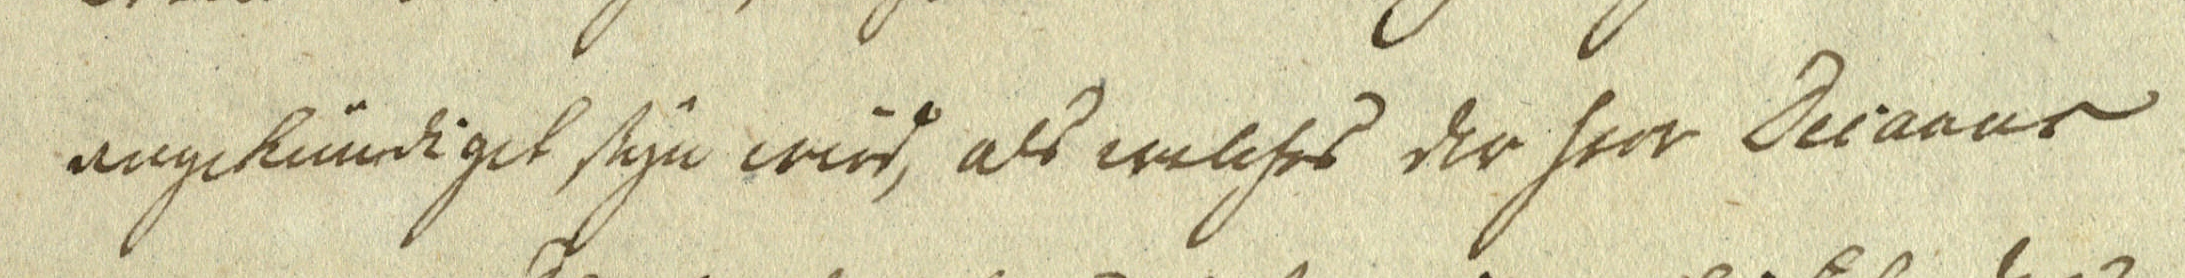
angekündiget seÿn wird, als welches der Herr Decanus
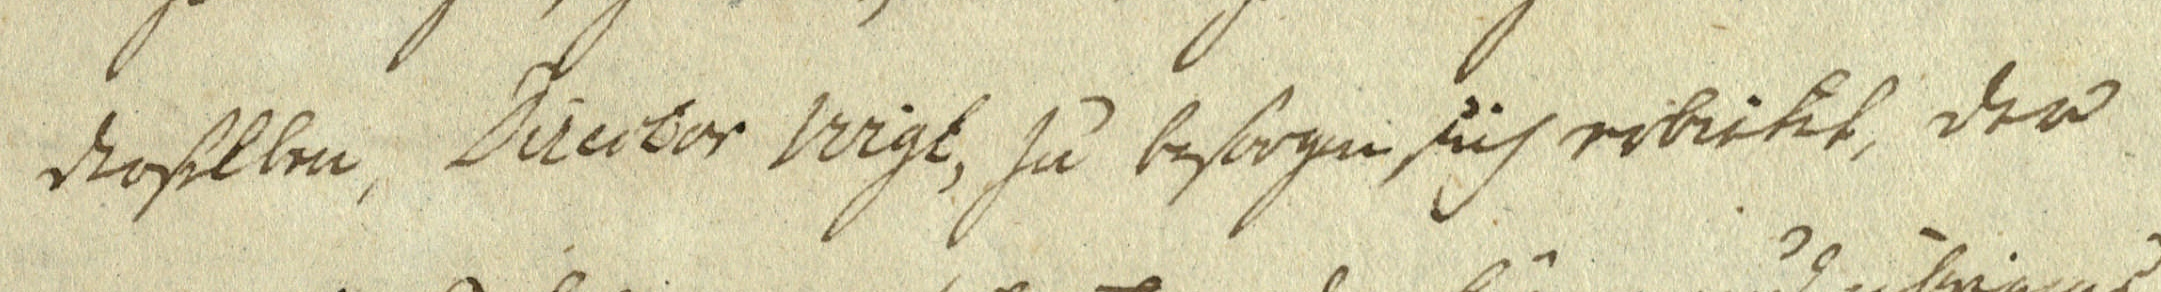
derselben Director Voigt, zu besorgen sich erbietet, der
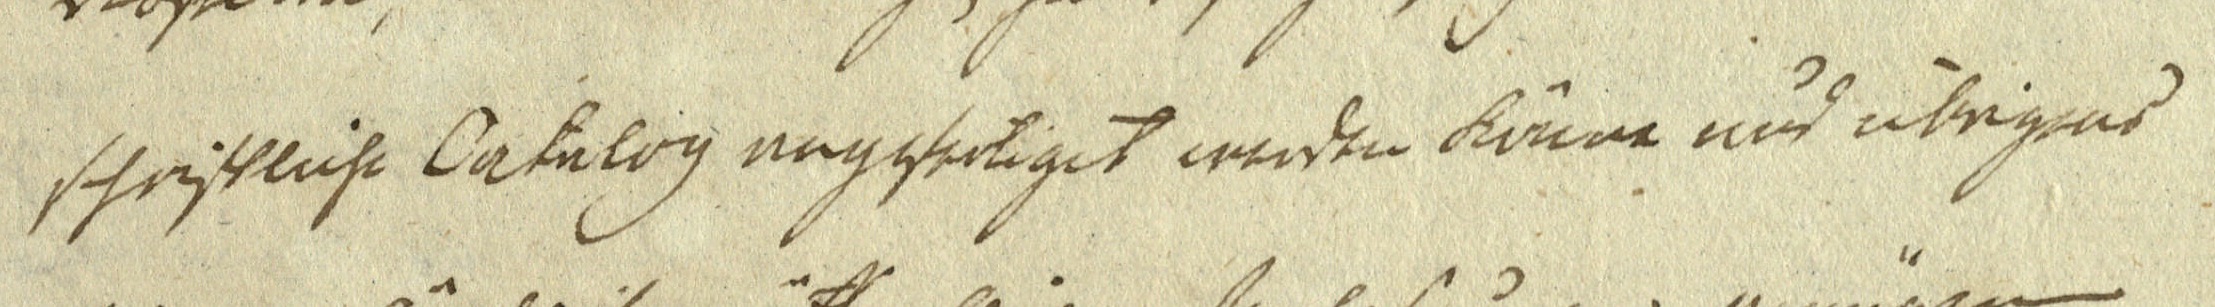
schriftliche Catalog angefertiget werden könne und übrigens
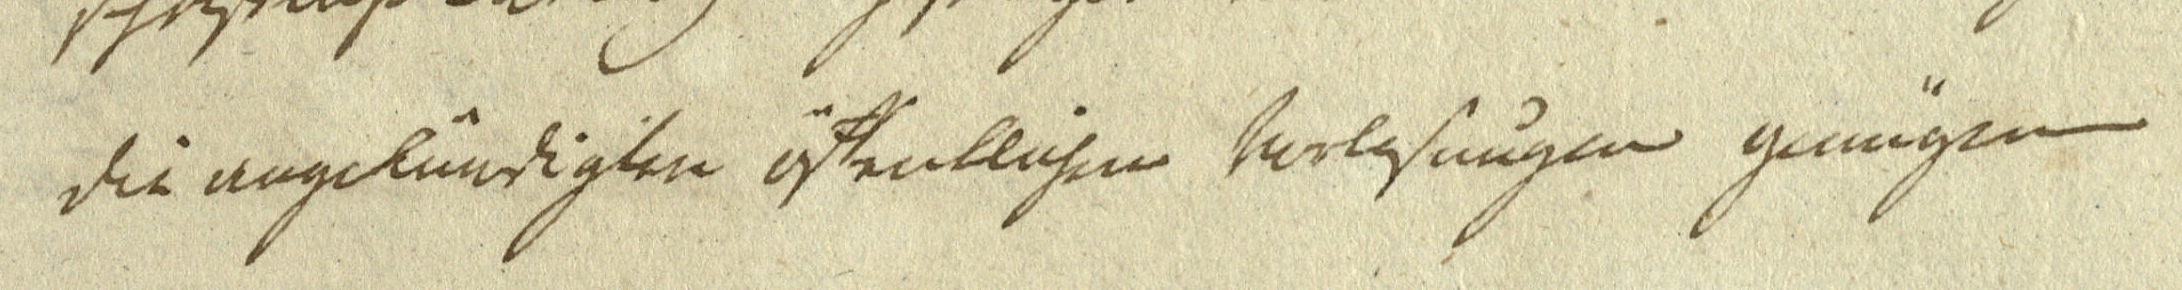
die angekündigten öffentlichen Vorlesungen genügen
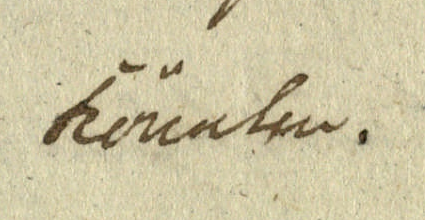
könnten.
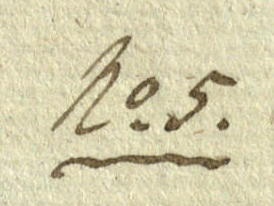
Nº 5.
